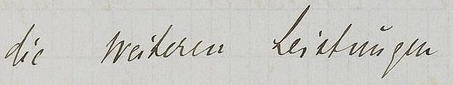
die weiteren Leistungen
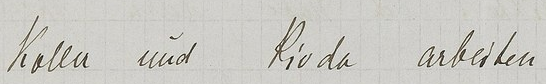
Koller und Pioda arbeiten
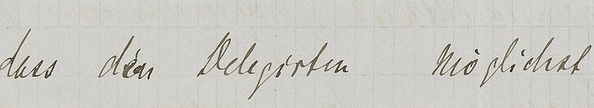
dass den Delegirten möglichst
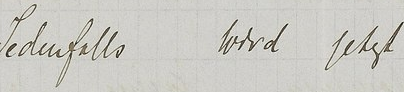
Jedenfalls wird jetzt
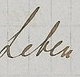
u es ist
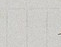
durch
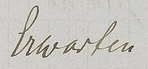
gegen mein
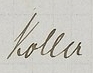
Erwarten
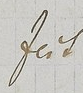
Leben
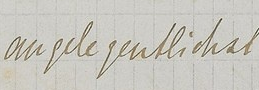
angelegentlichst
